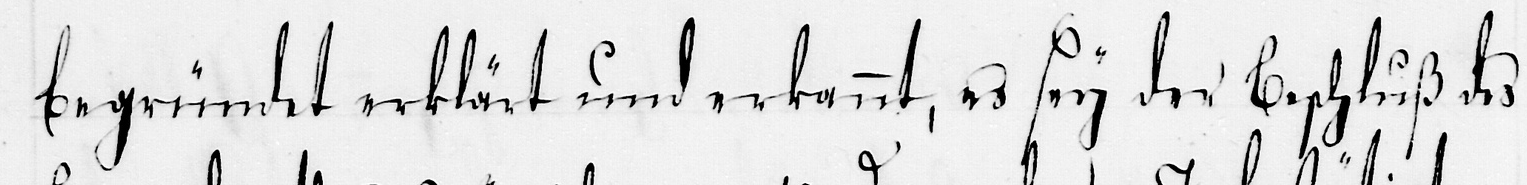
begründet erklärt und erkannt, es sey der Beschluß des
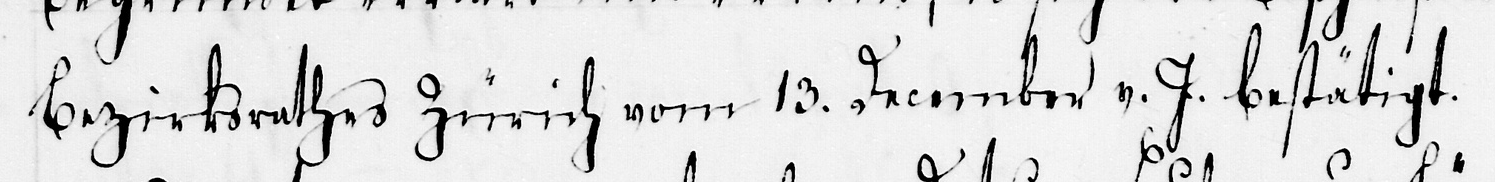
Bezirksrathes Zürich vom 13. December v. J. bestätigt.
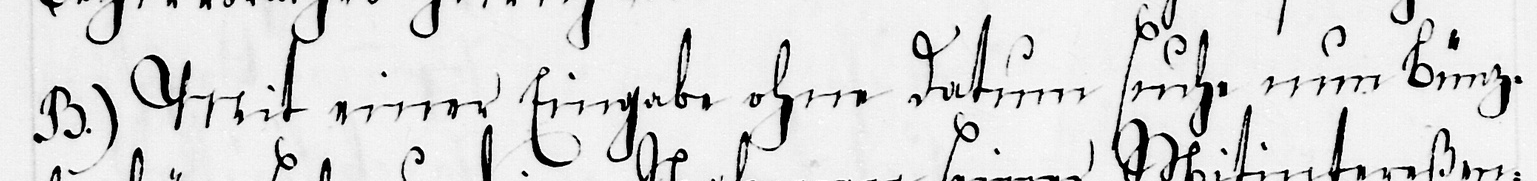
B.) Mit einer Eingabe ohne Datum suche nun Bünz¬
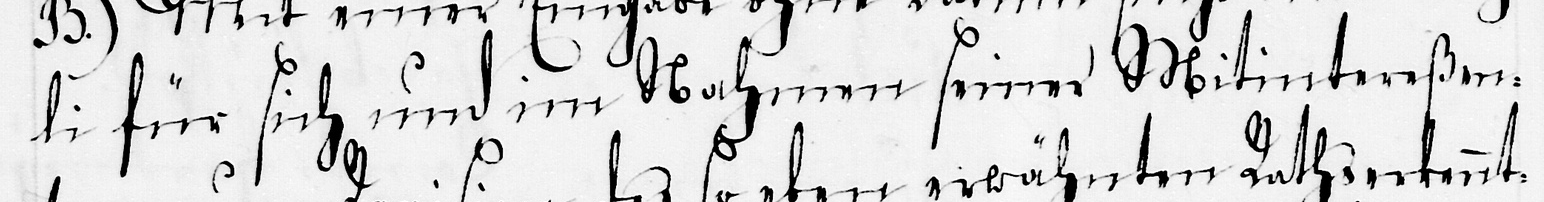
li für sich und im Nahmen seiner Mitintereßen¬
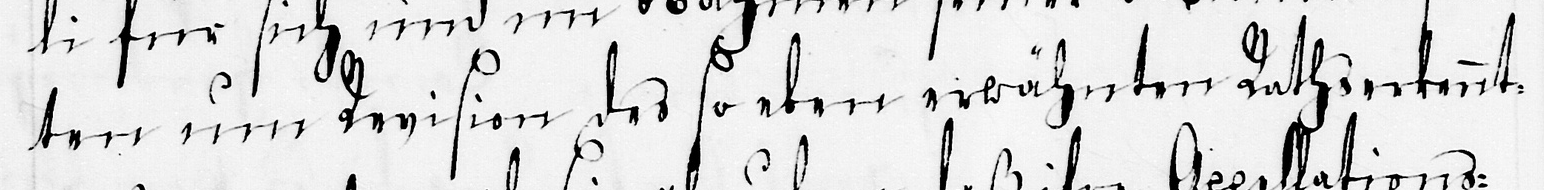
ten um Revision des so eben erwähnten Rathserkennt¬
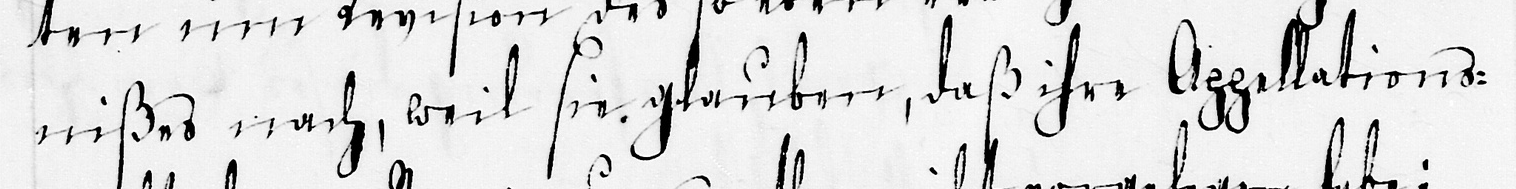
nißes nach, weil sie glauben, daß ihre Appellations¬
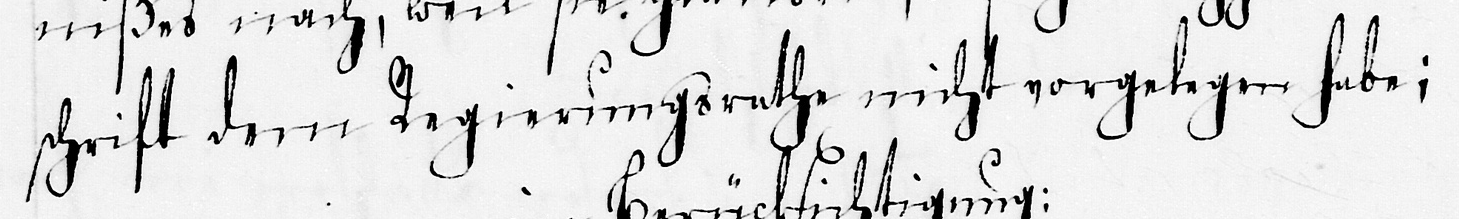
schrift dem Regierungsrathe nicht vorgelegen habe;
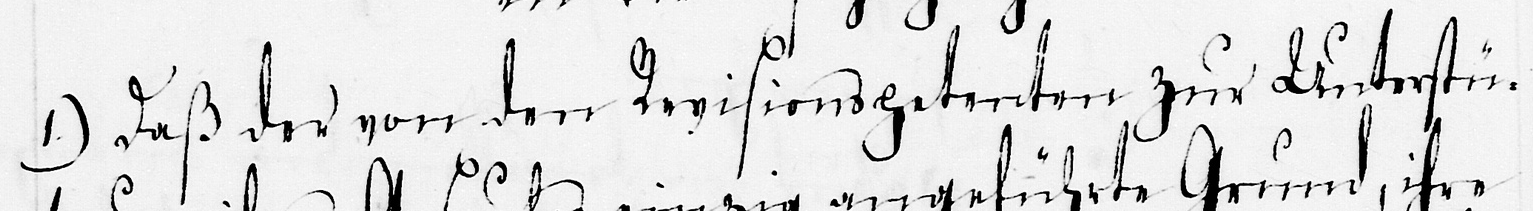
1.) Daß der von den Revisionspetenten zur Unterstü¬
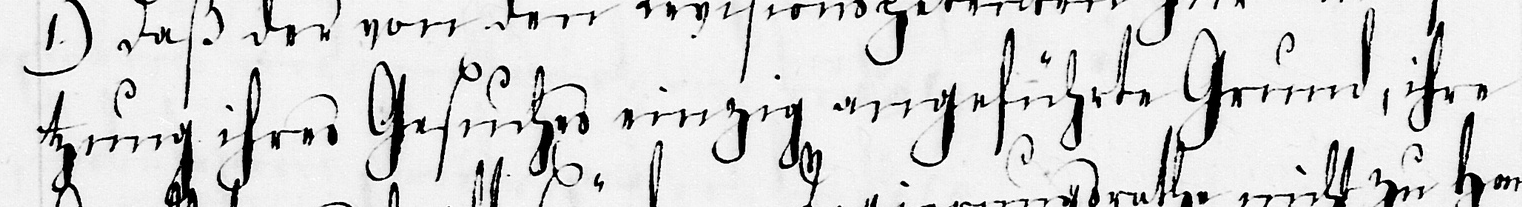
tzung ihres Gesuches einzig angeführte Grund, ihre
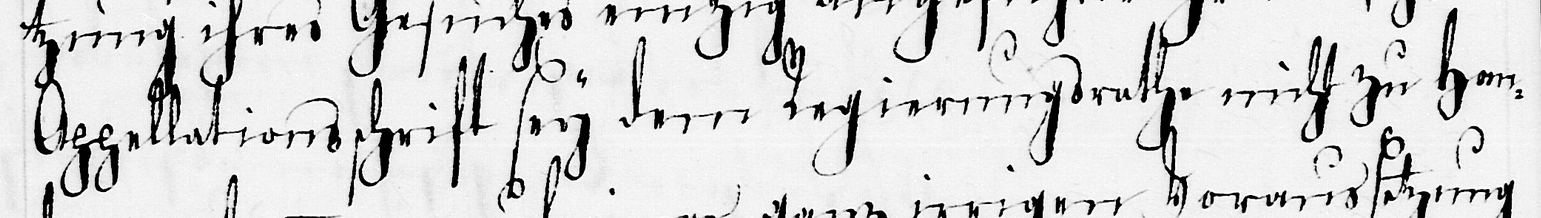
Appellationsschrift sey dem Regierungsrathe nicht zu Han¬
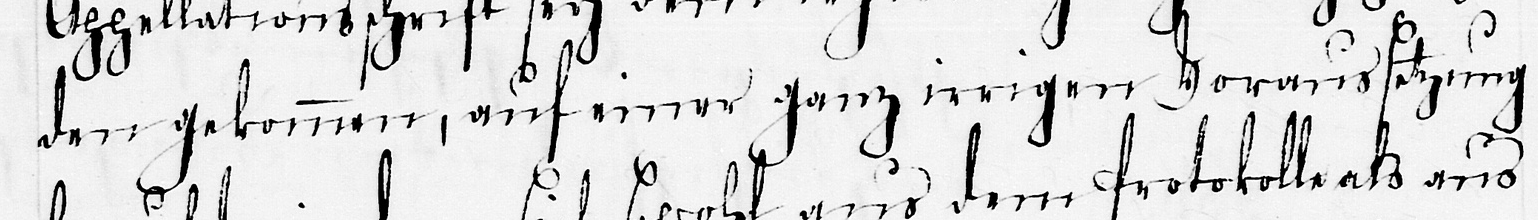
den gekommen, auf einer ganz irrigen Voraussetzung
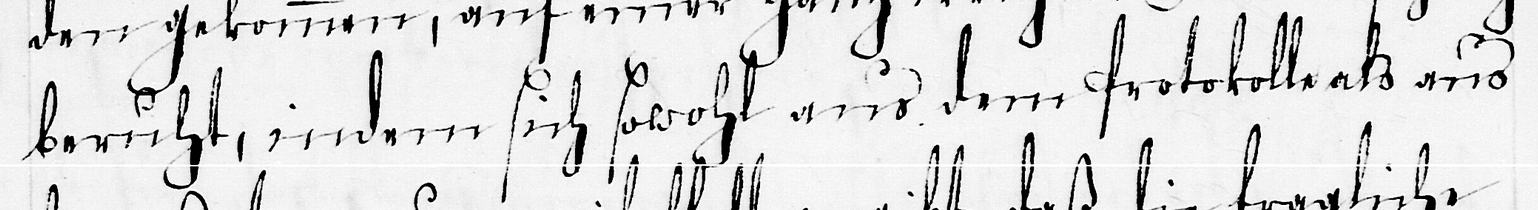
beruht, indem sich sowohl aus dem Protokolle als aus
